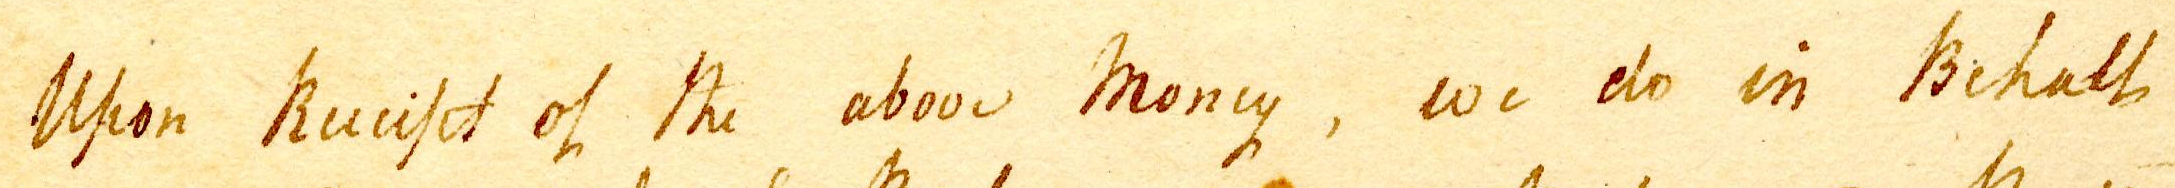Upon Receipt of the above Money, we do in Behalf
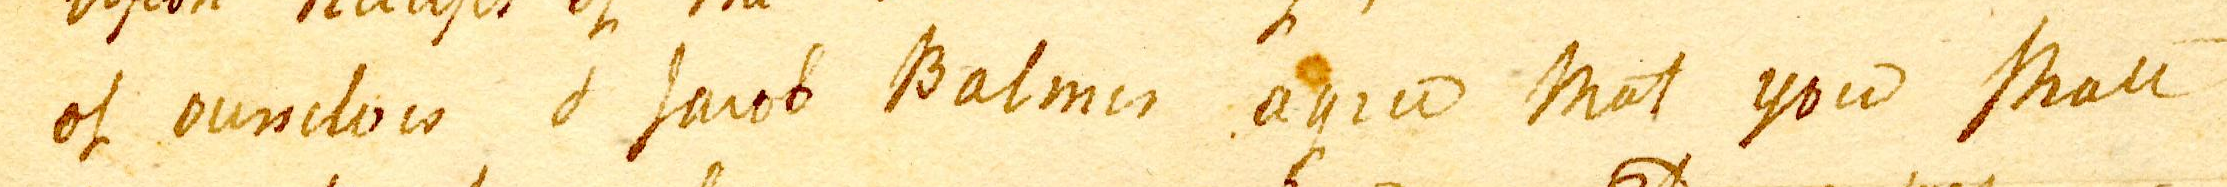of ourselves, & Jacob Balmes agree that you shall
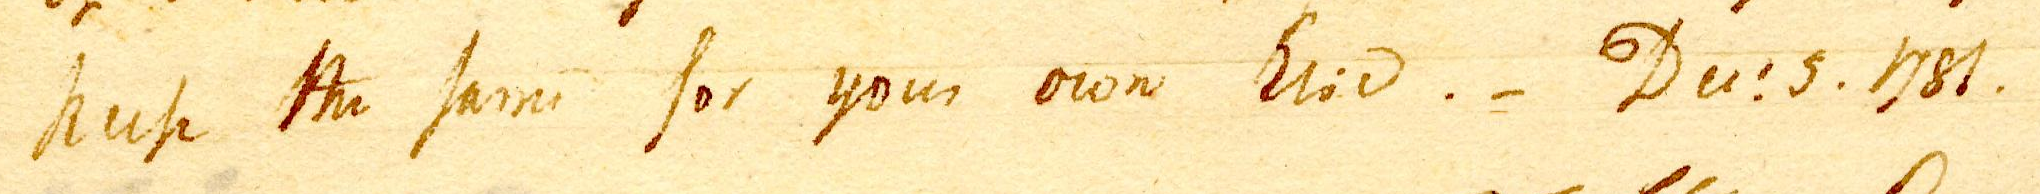keep the farm for your own Elsie. Dec: 5. 1781
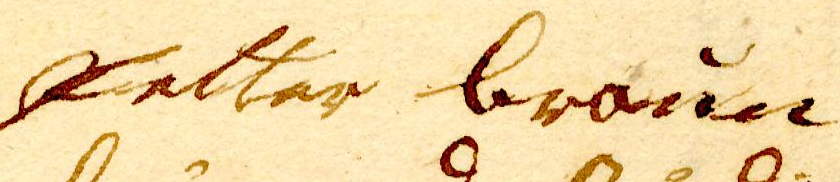Petter braun
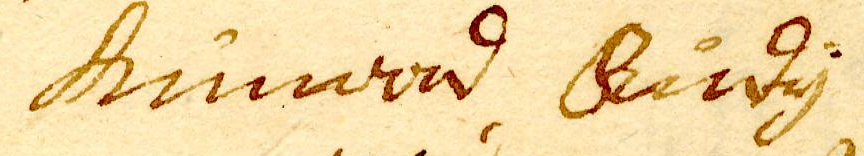Conrad Ready
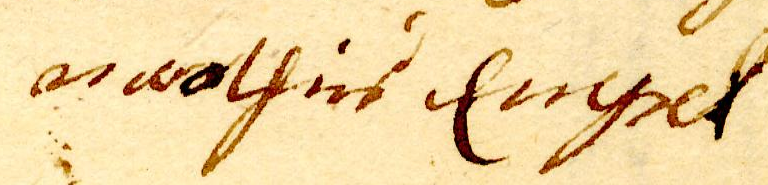Matthew Engel
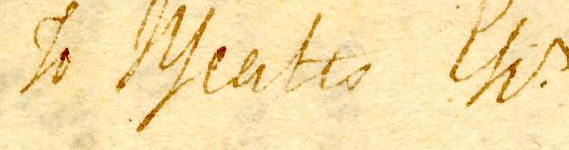To J. Yeates Esq.
